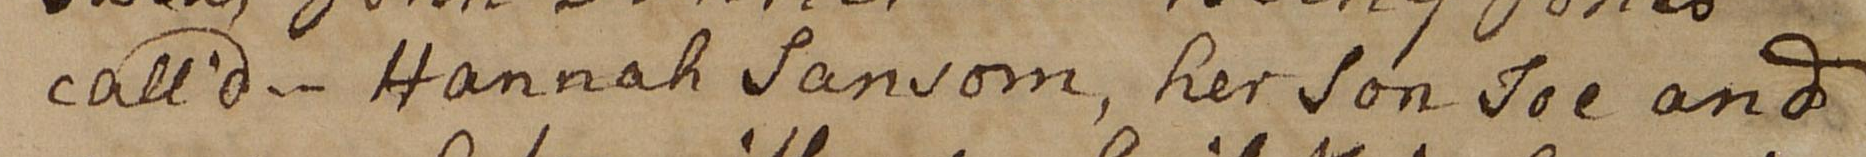call'd- Hannah Sansom, her Son Joe and
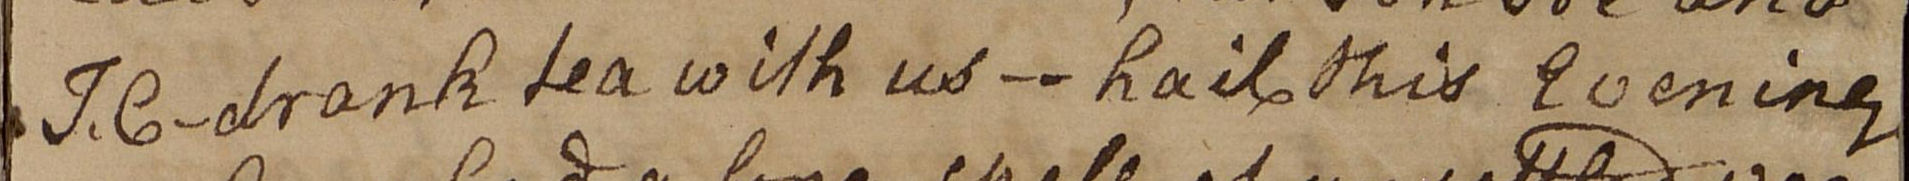J.C- drank tea with us- hail this Evening
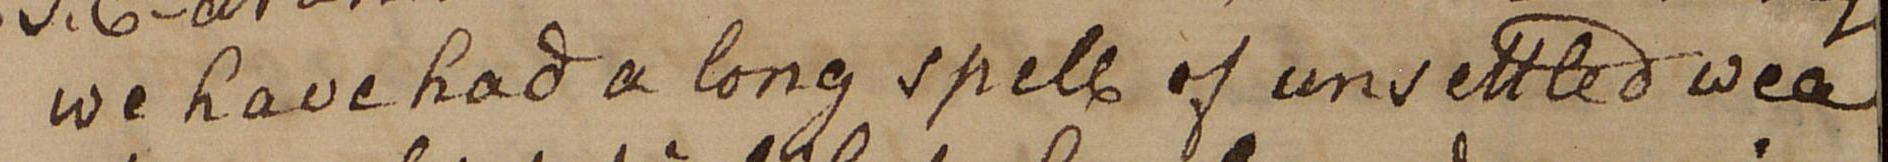we have had a long spell of unsettled wea
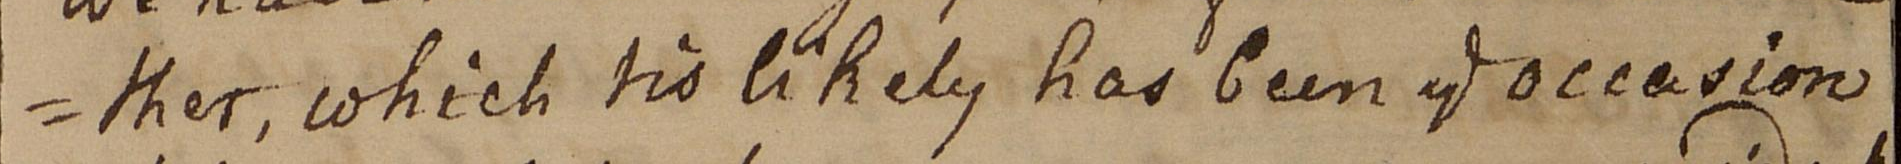-ther, which tis likely has been y^e occasion
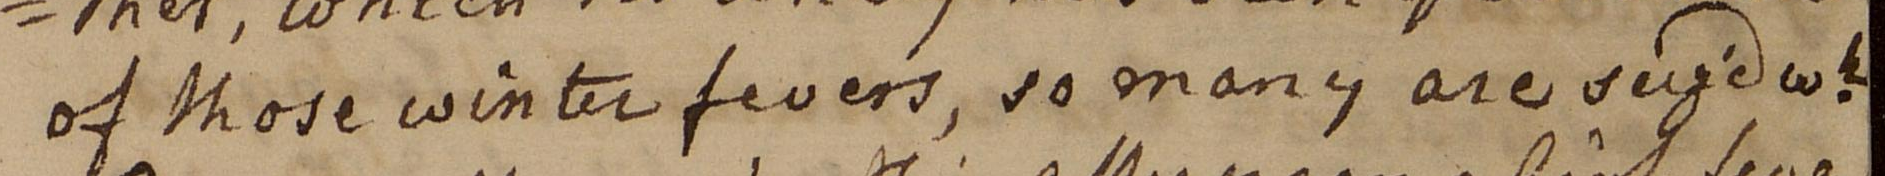of those winter fevers, so many are seiz'd w^h.
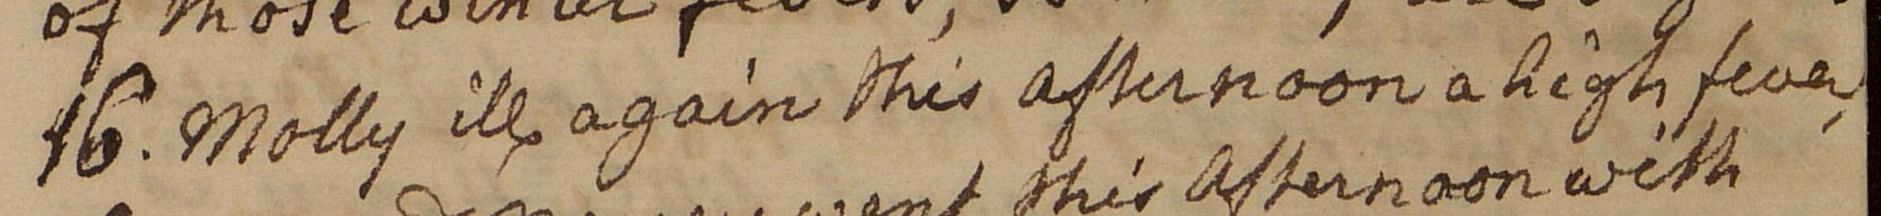16. Molly ill again this afternoon a high fever,
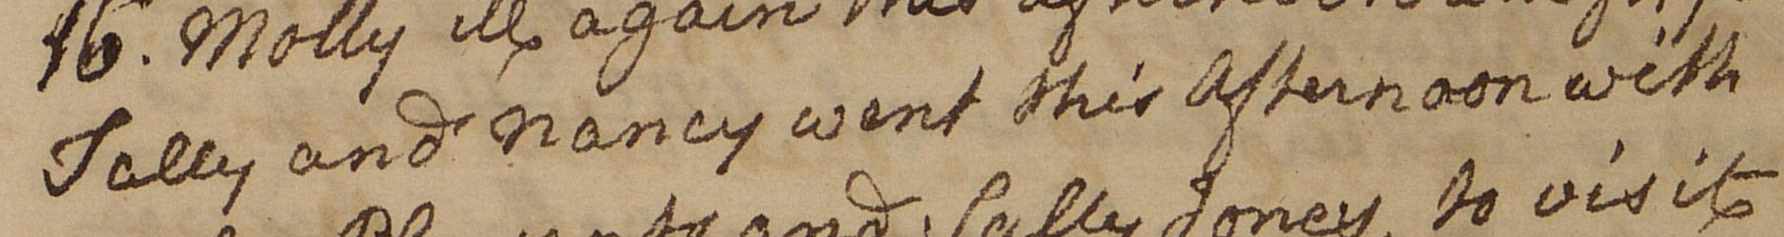Sally and Nancy went this afternoon with
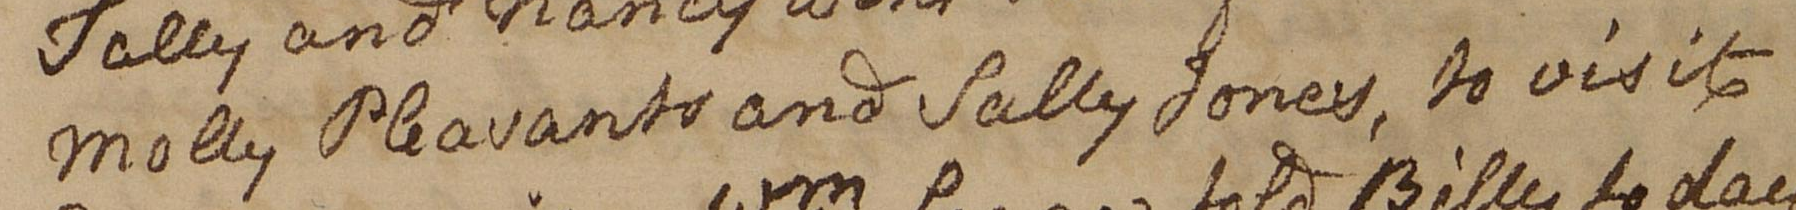Molly Pleasants and Sally Jones, to visit
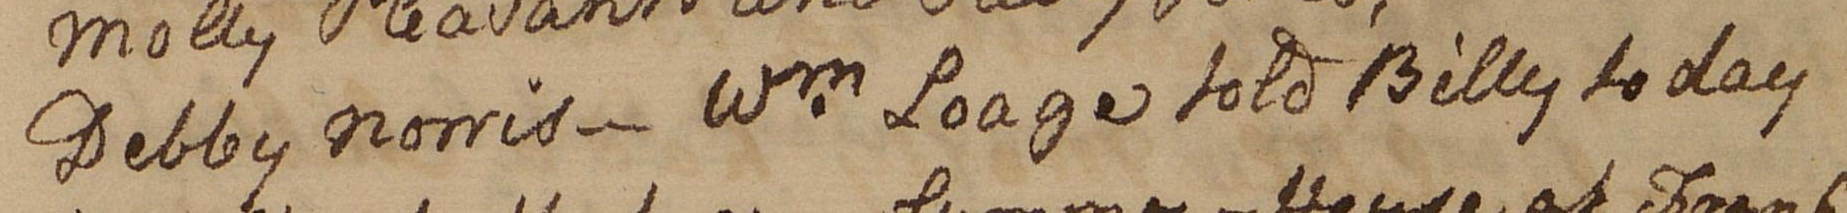Debby Norris- W^m. Loage told Billy today
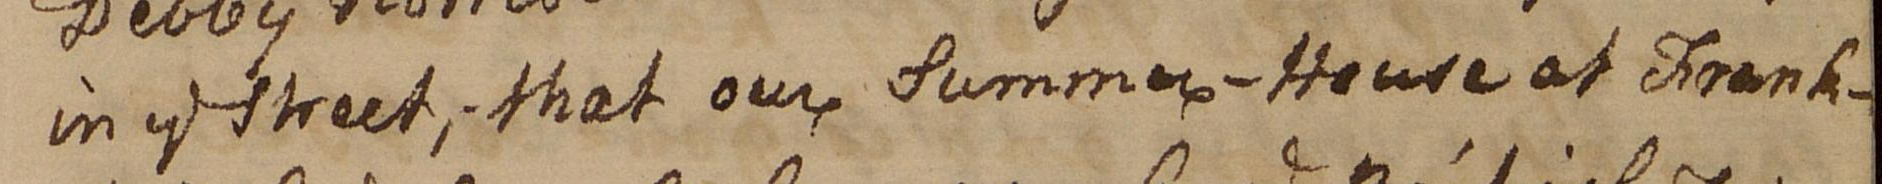in y^e street, that our Summer-House at Frank-
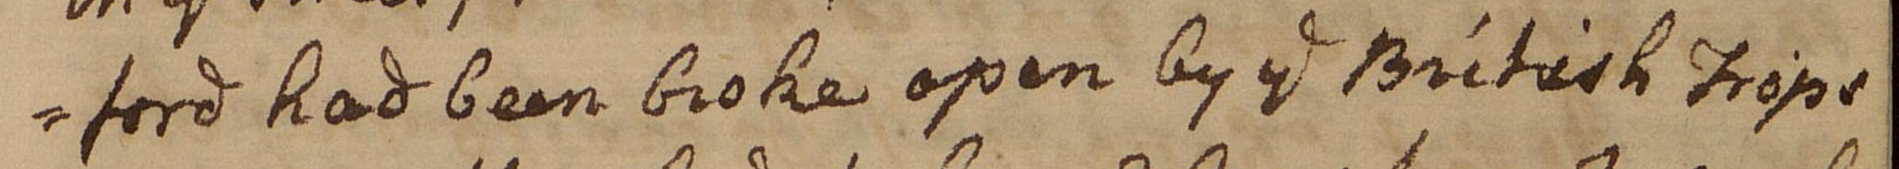-ford had been broke open by y^e British Trops
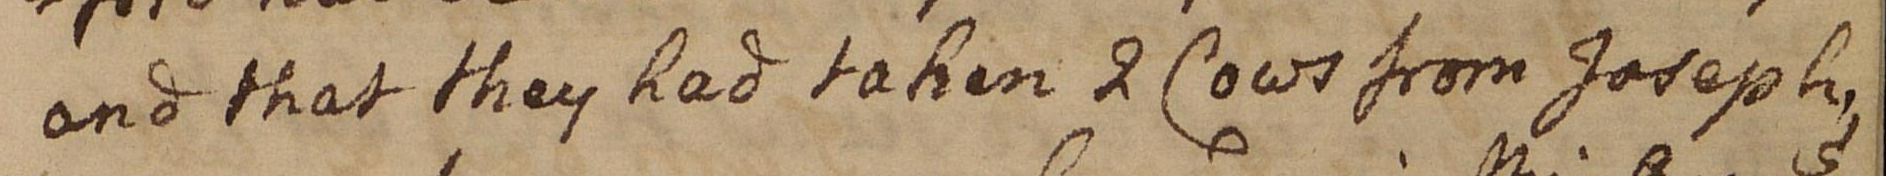and that they had taken 2 Cows from Joseph,
